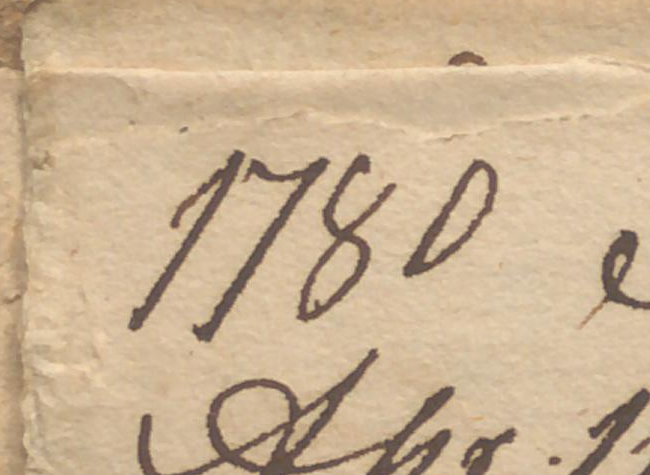1780
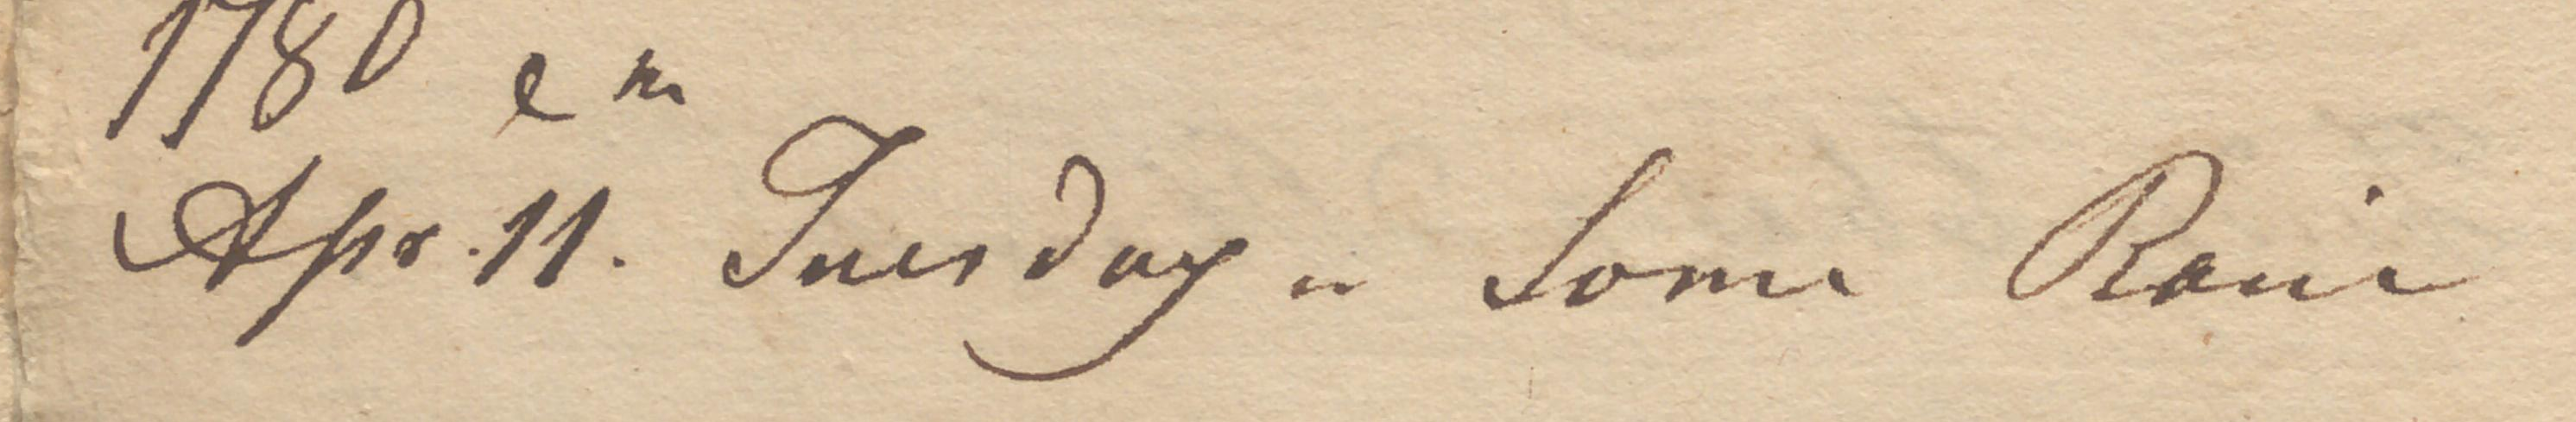Apr^l. 11th. Tuesday. Some Rain
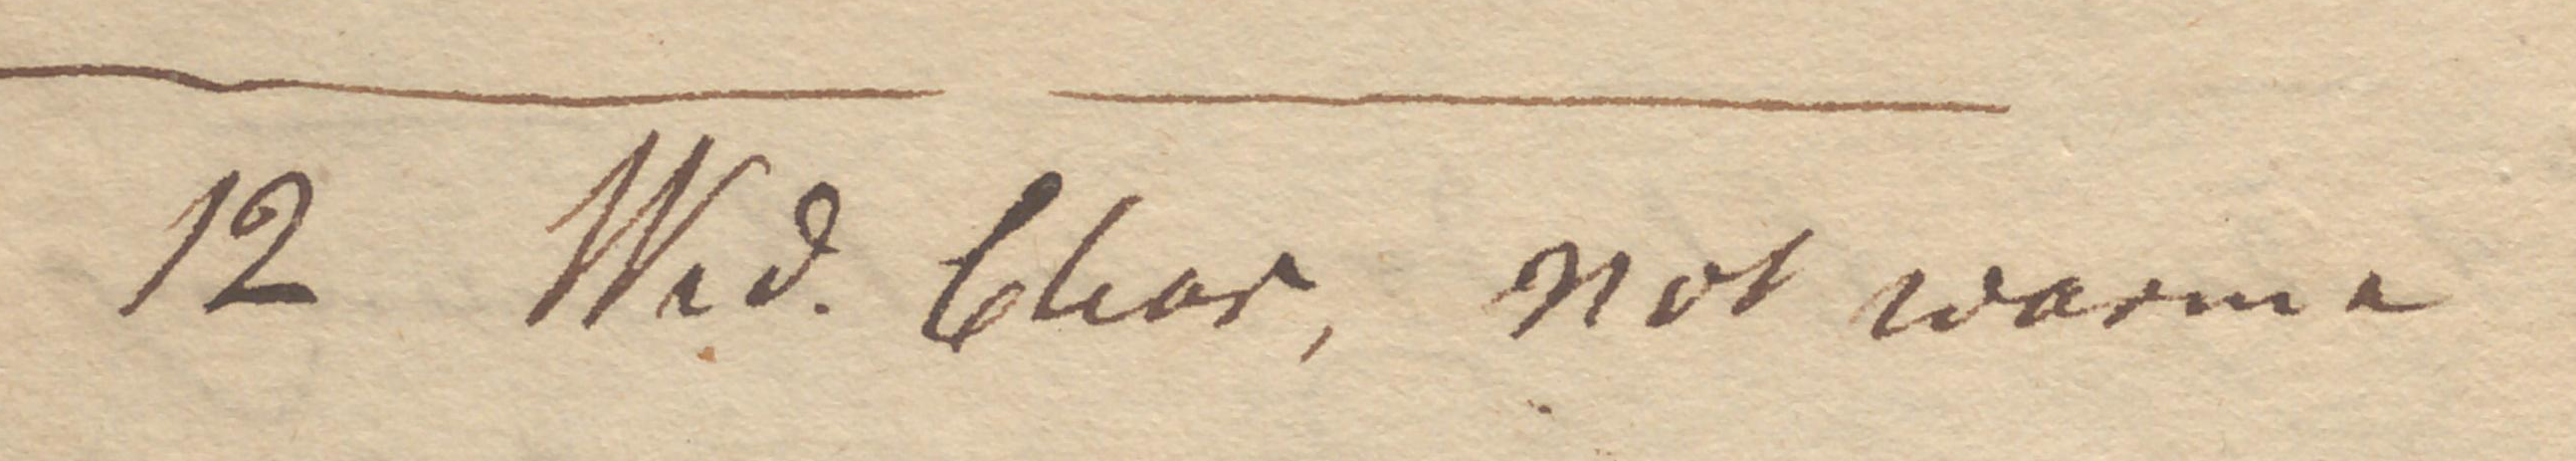12 Wed. Clear, not warme
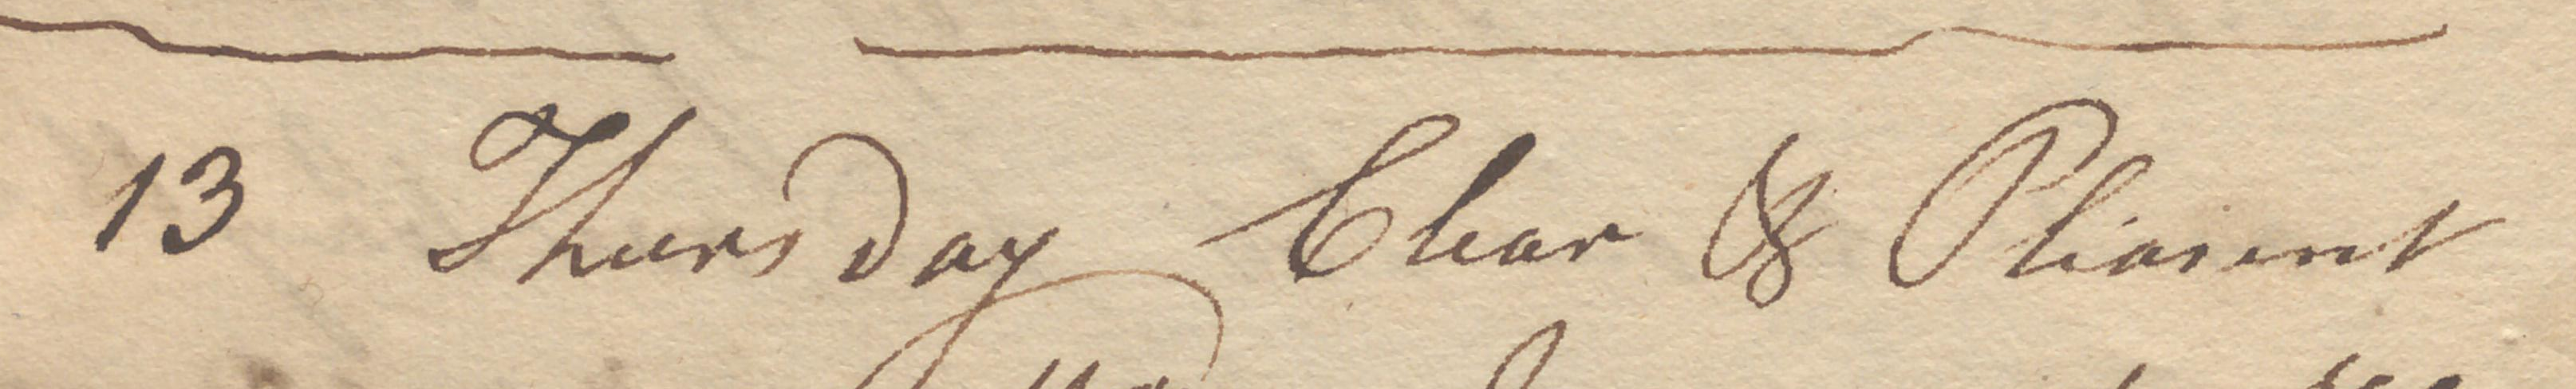13 Thursday Clear & Pleasent
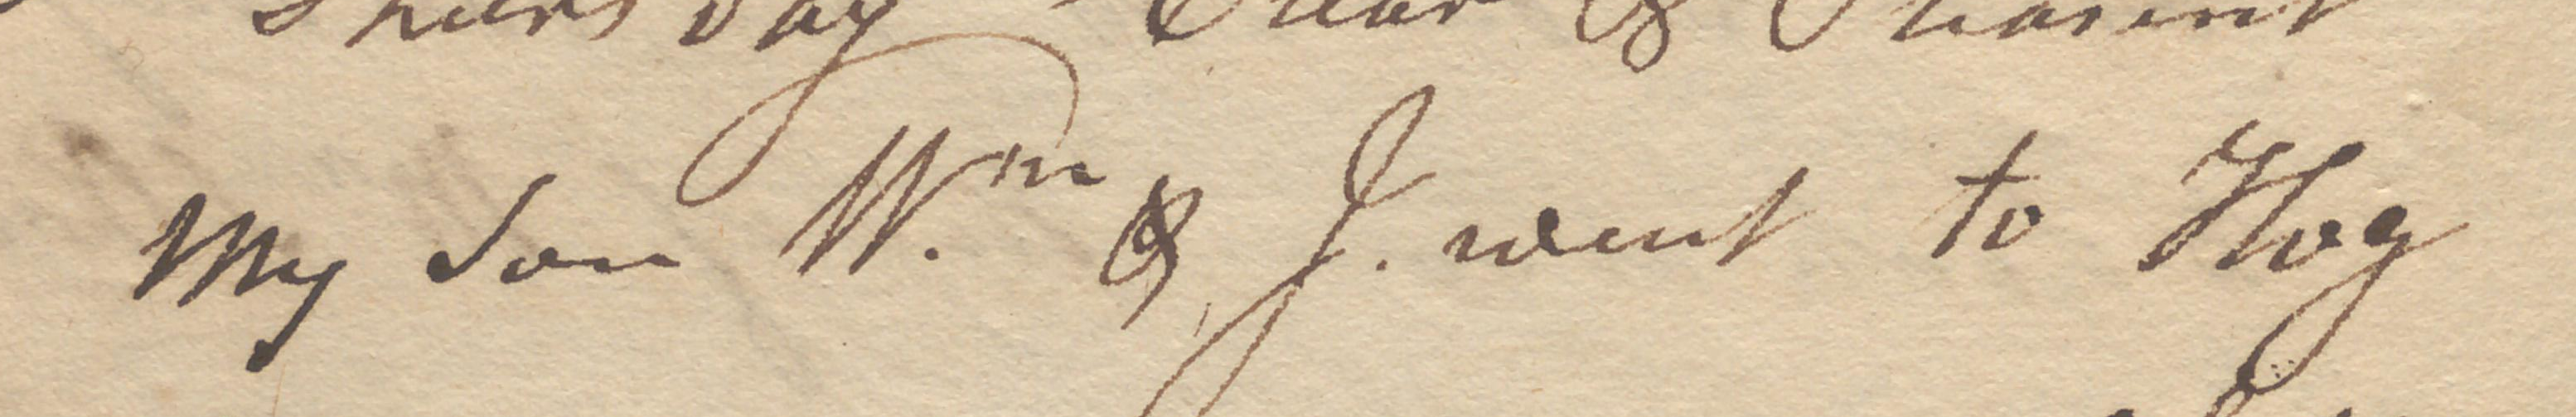My son W^m. & J. went to Hog
